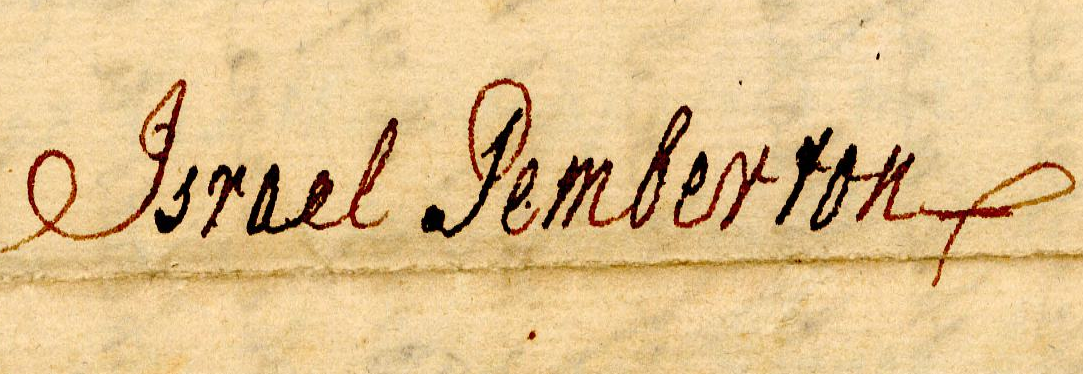Israel Pemberton
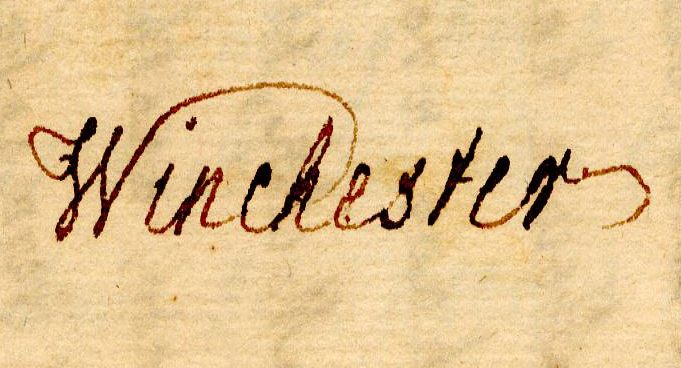Winchester
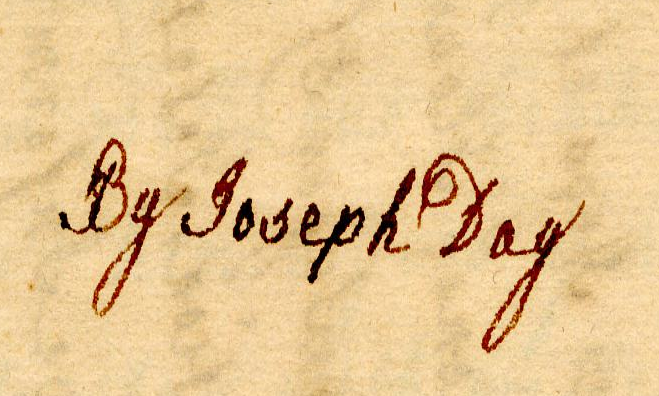By Joseph Day
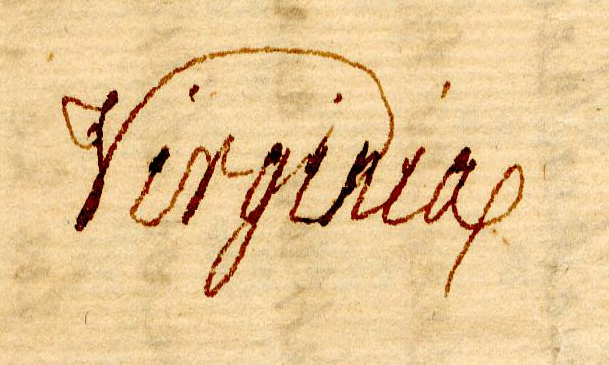Virginia
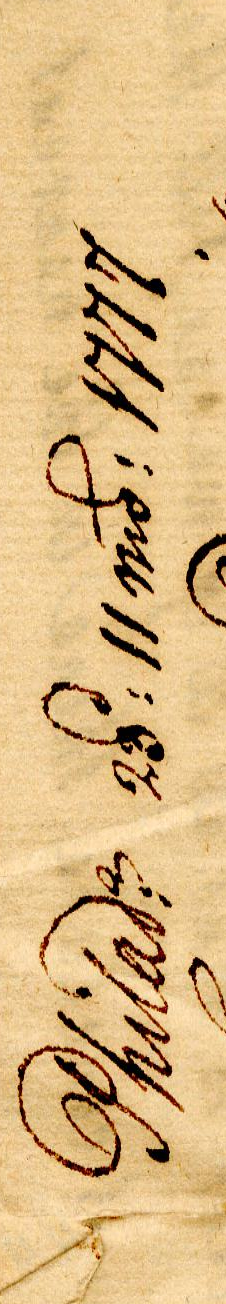Philad^a: 23^d: 11 mo: 1777
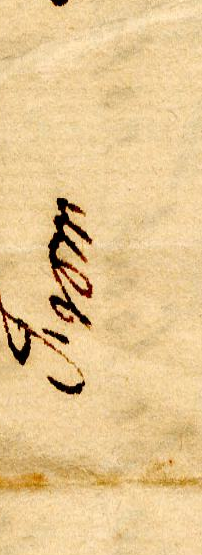From
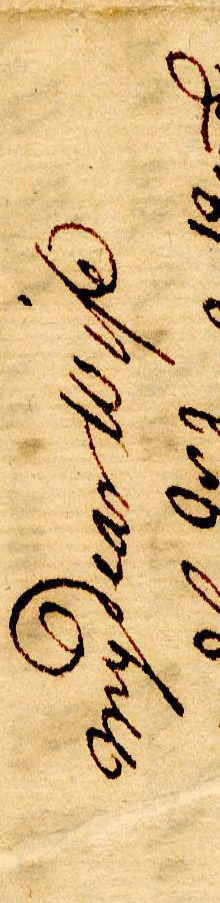my dear Wife
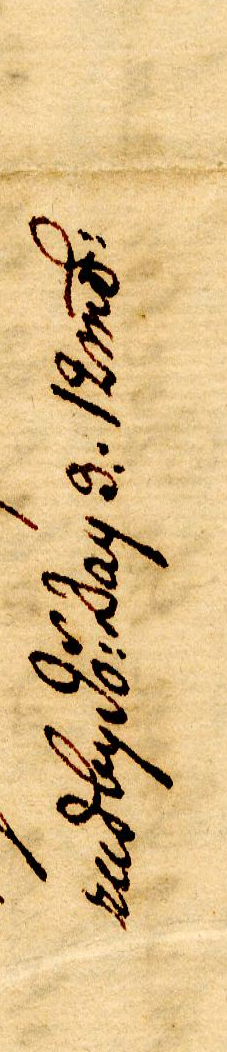recd by Jo^s: Day 3: 12 mo:
